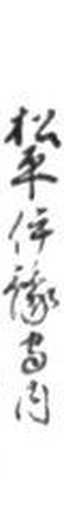松平伊予守内
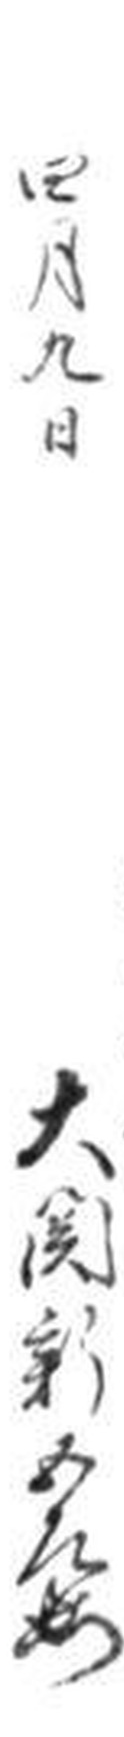四月九日大関新五左衛門
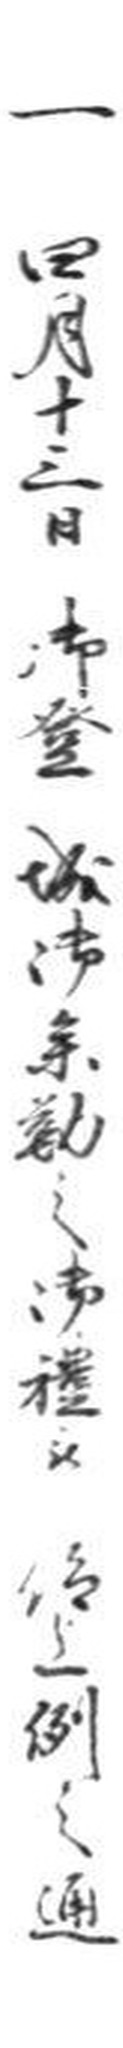一四月十三日御登城御参勤之御礼被仰上例之通
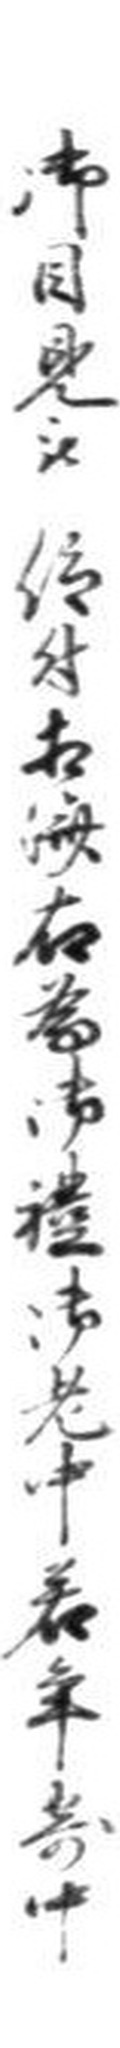御目見被仰付相済右為御礼御老中若年寄中
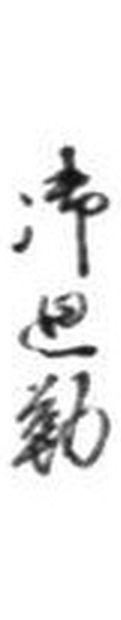御廻勤
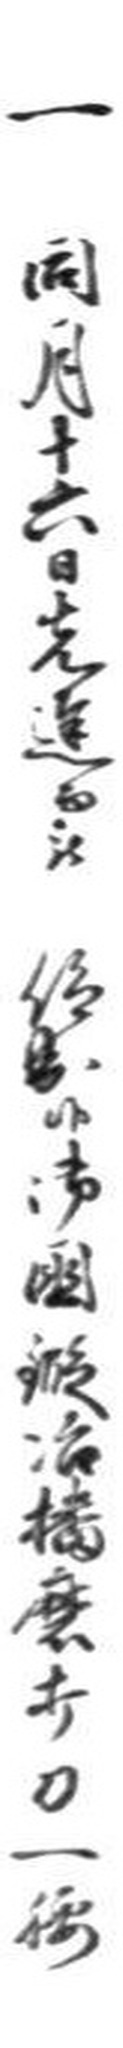一同月十六日先達而被仰出候御国鍛冶播磨打刀一腰
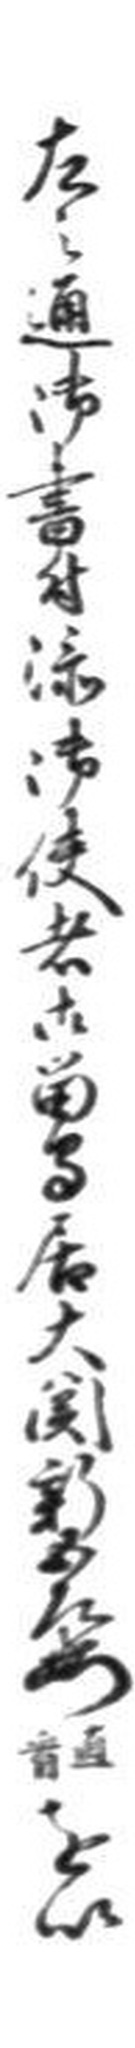左之通御書付添御使者御留守居大関新五左衛門直看を以
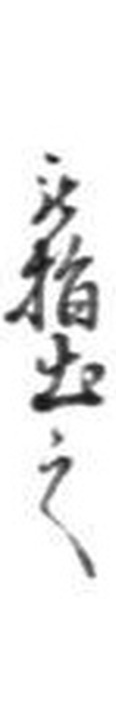被指出之
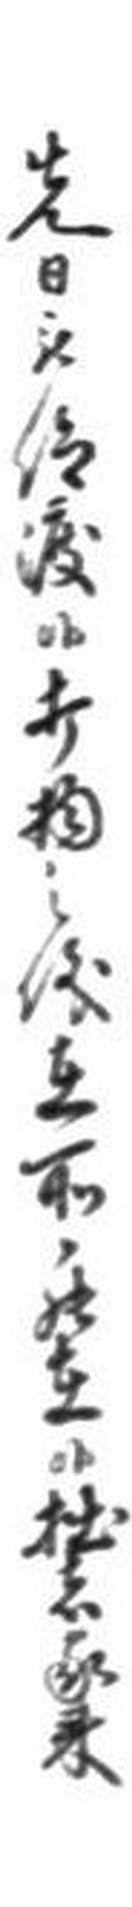先日被仰渡候打物之儀在所罷在候拙者家来
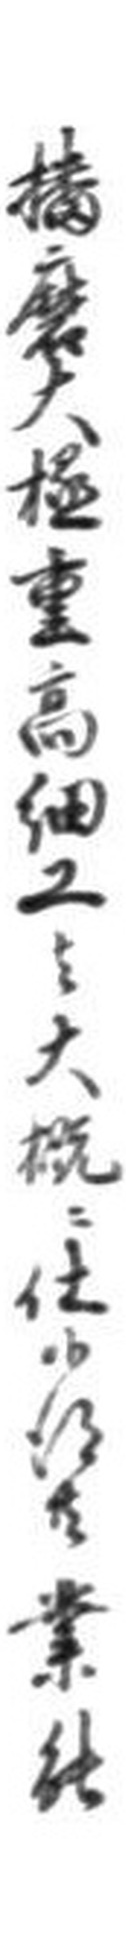播磨大極重高細工者大概ニ仕候得共業能
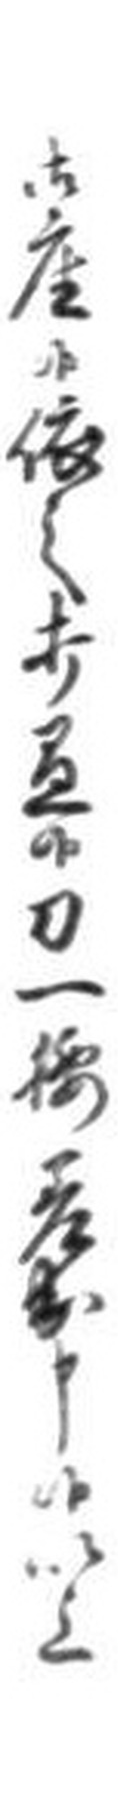御座候依之打置候刀一腰差出申候以上
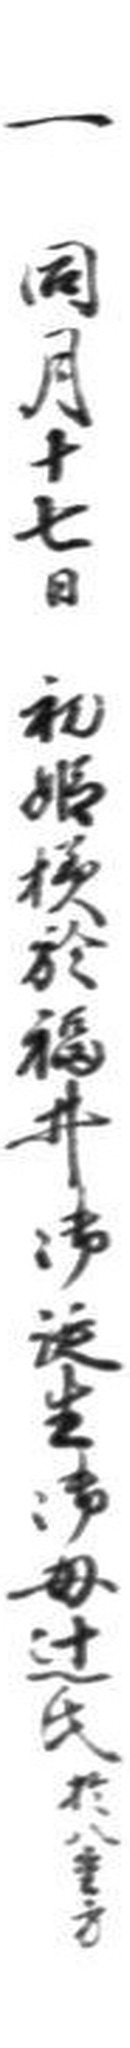一同月十七日初姫様於福井御誕生御母辻氏於八重方

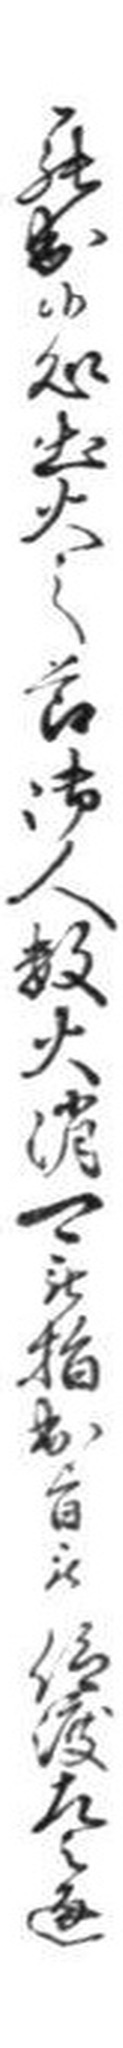罷出候処出火之節御人数火消可被指出旨被仰渡左之通
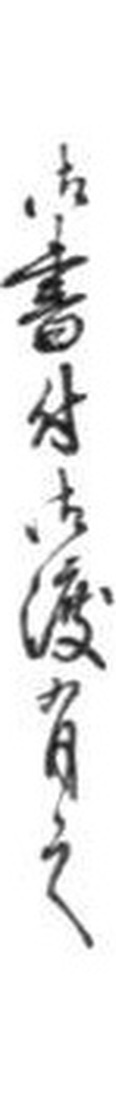御書付御渡有之
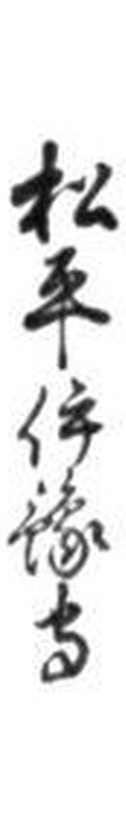松平伊予守
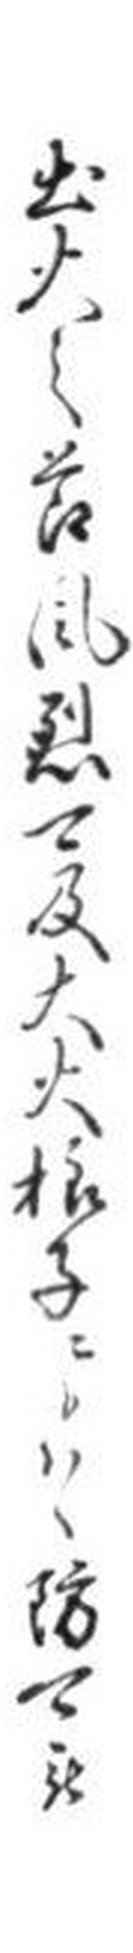出火之節風烈可及大火様子ニ候八ヽ防可被
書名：家譜 三十四 吉邦公 従享保五年到同六年
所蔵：福井県文書館 Fukui Prefectural Archives
